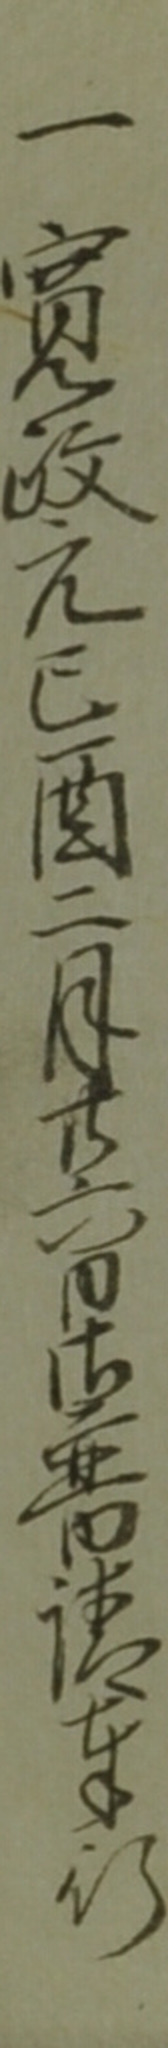一寛政元己酉二月廿六日御普請奉行
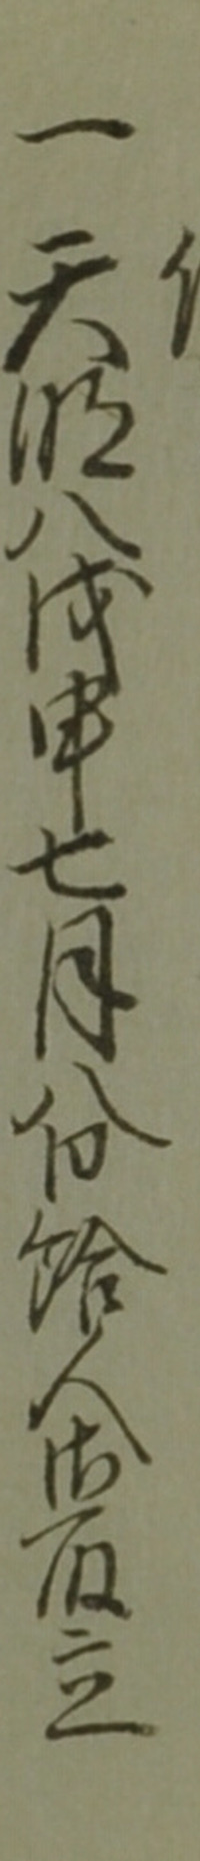一天明八戊申七月八日給人御取立
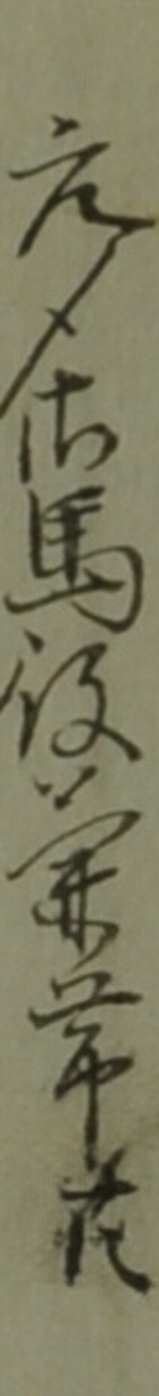元〆御馬役兼帯共
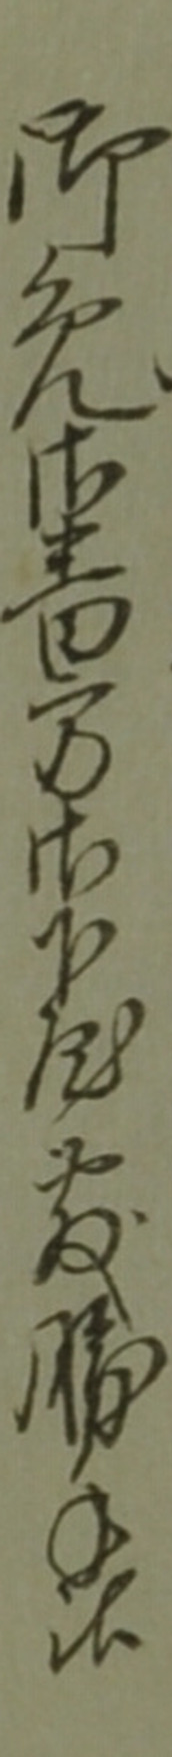御免御番方御下屋敷勝手被
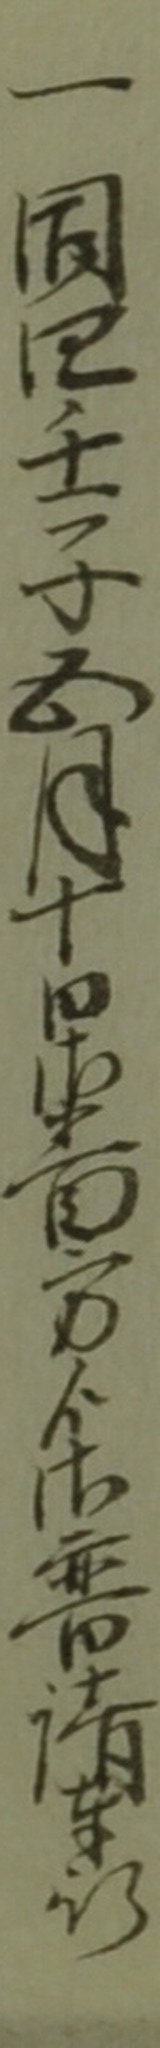一同四壬子五月十日御番方より御普請奉行
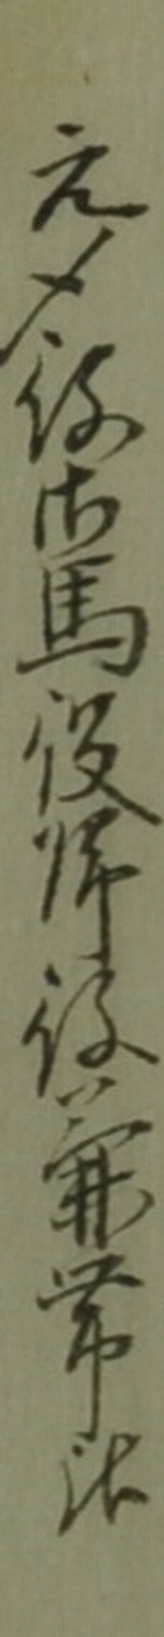元〆役御馬役帰役兼帯被
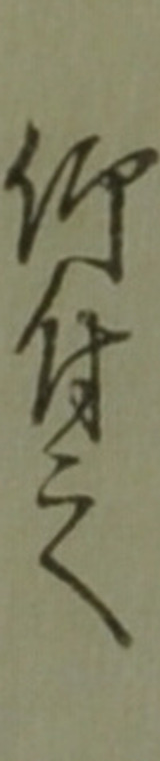仰付之
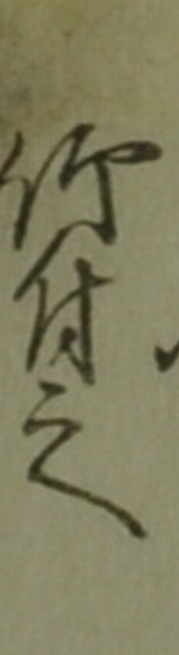仰付之
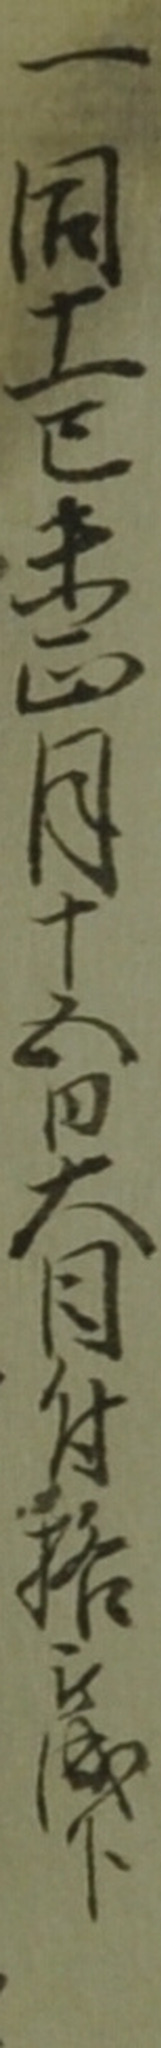一同十一己未正月十五日大目付格被成下
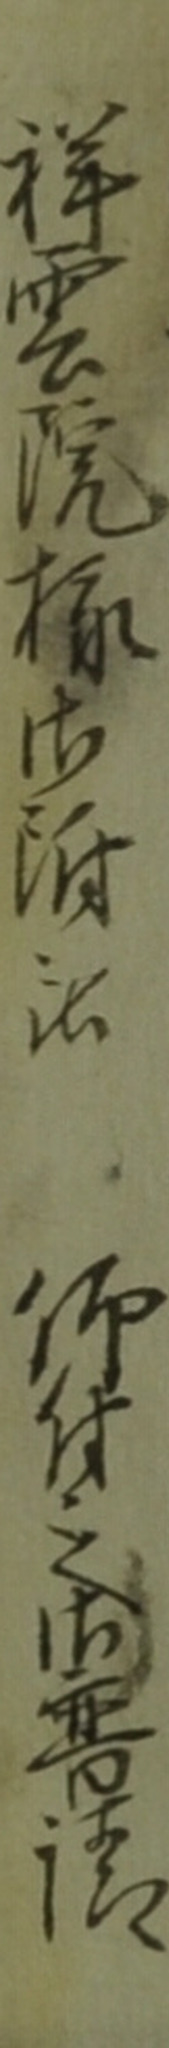祥雲院様御附被仰付之御普請
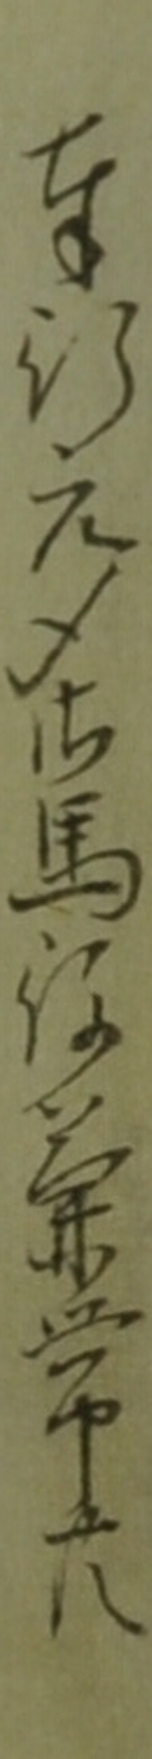奉行元〆御馬役兼帯共
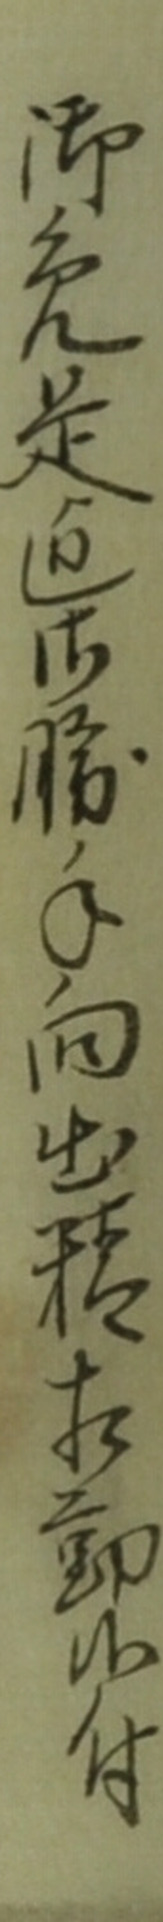御免是迄御勝手向出精相勤候付

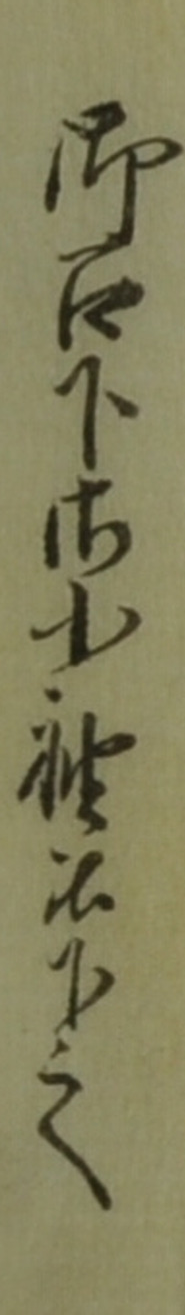御召下御小袖被下之
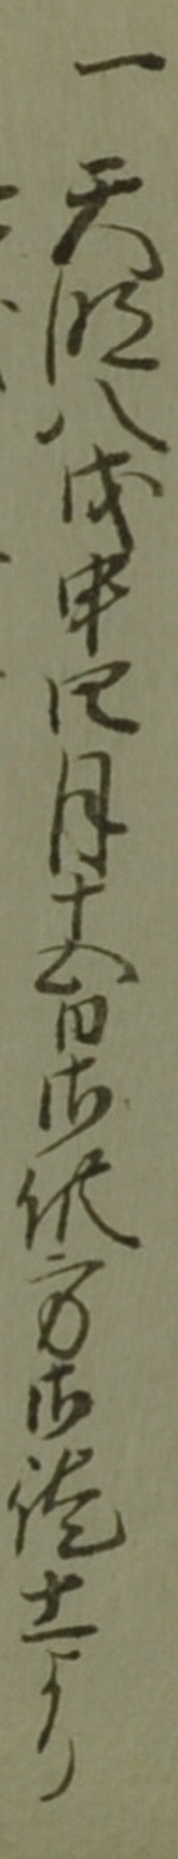一天明八戊申四月十五日御供方御徒士より
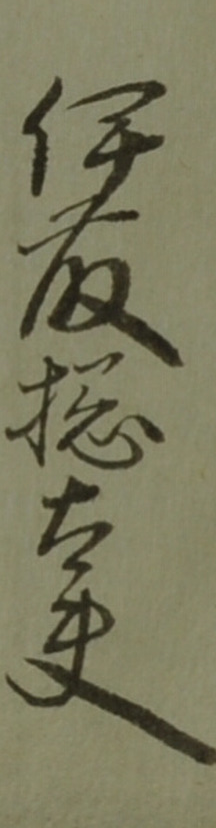伊藤総太夫
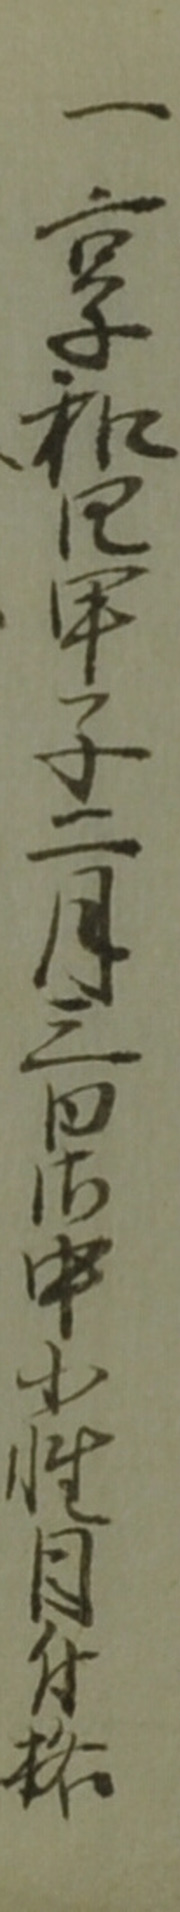一享和四甲子二月三日御中小性目付格
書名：諸御役代々録（八）
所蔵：伊那市立高遠町図書館・合同会社AMANE
